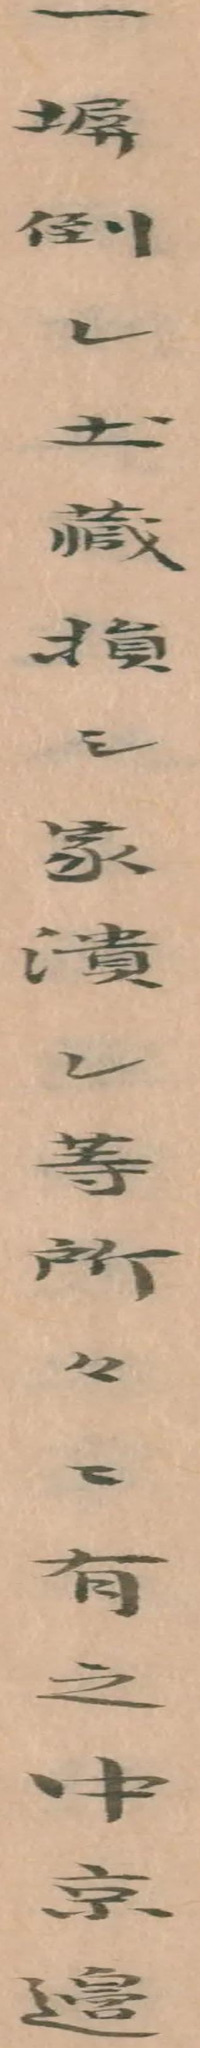一塀倒レ土蔵損シ家潰シ等所々二有之中京辺
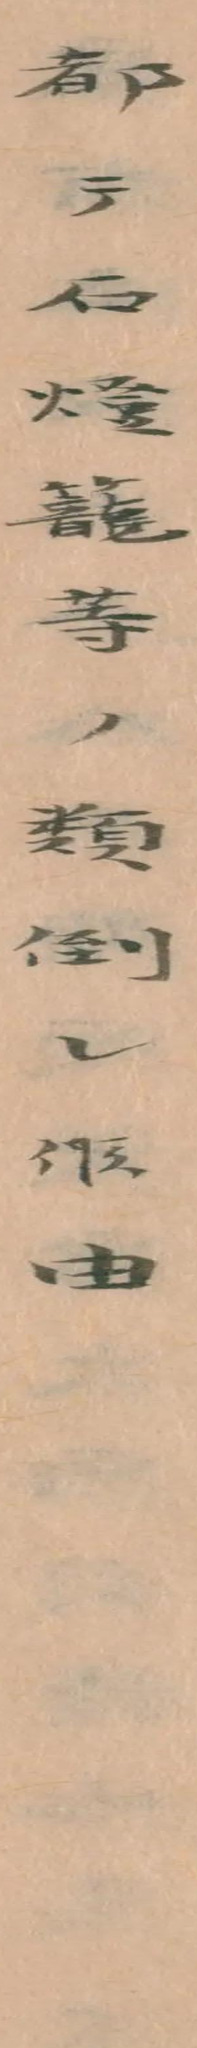都テ石燈籠等ノ類倒レ候由
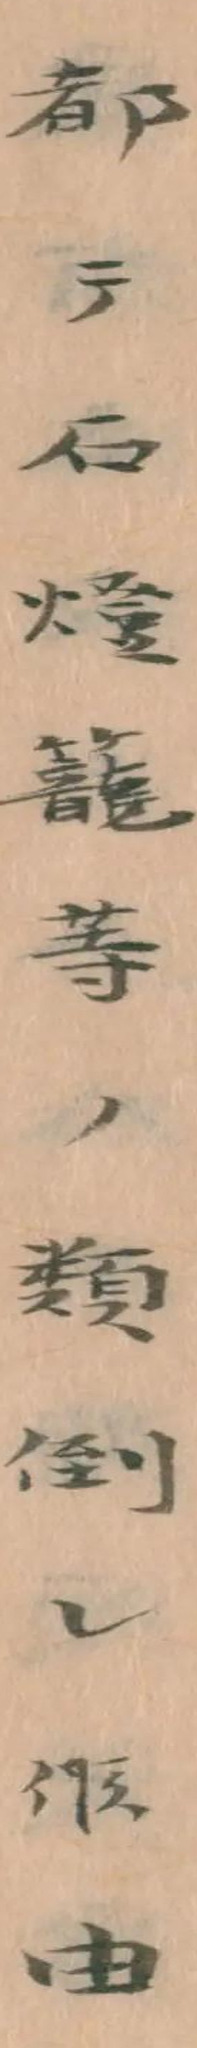都テ石燈籠等ノ類倒レ候由
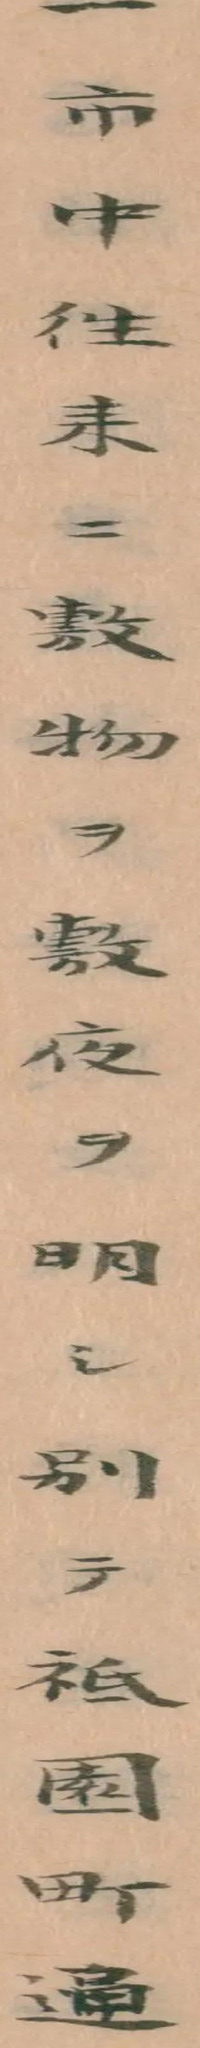一市中往来二敷物ヲ敷夜ヲ明シ別テ祇園町通
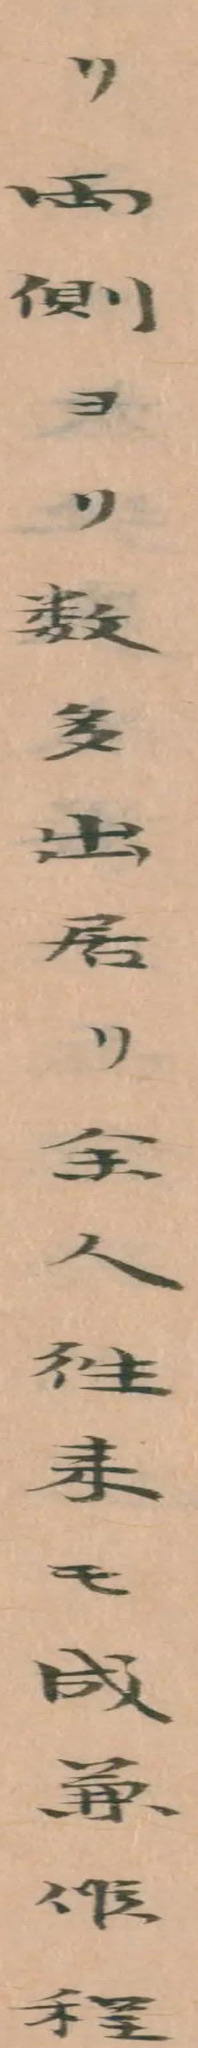リ両側ヨリ数多出居り余人往来モ成兼候程
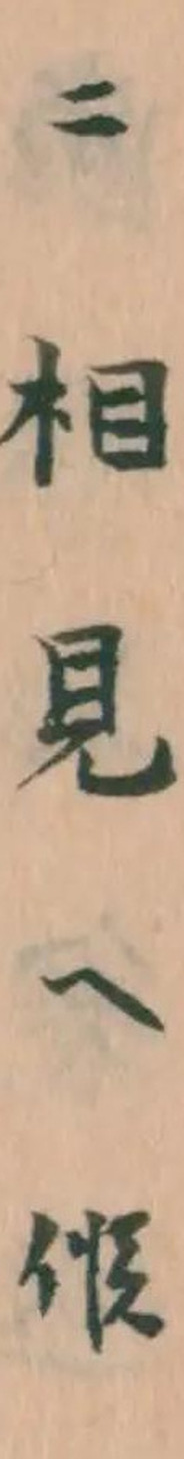二相見へ候
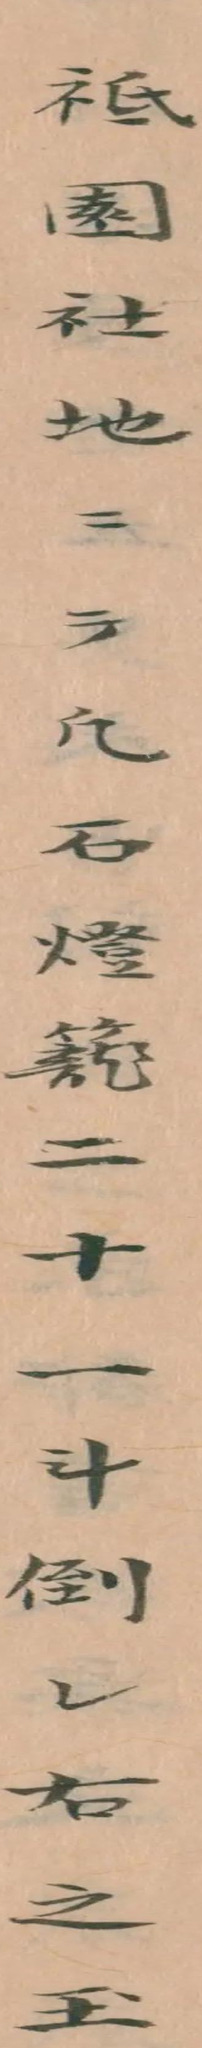一祇園社地ニテ凡石燈籠二十一斗倒レ右之玉
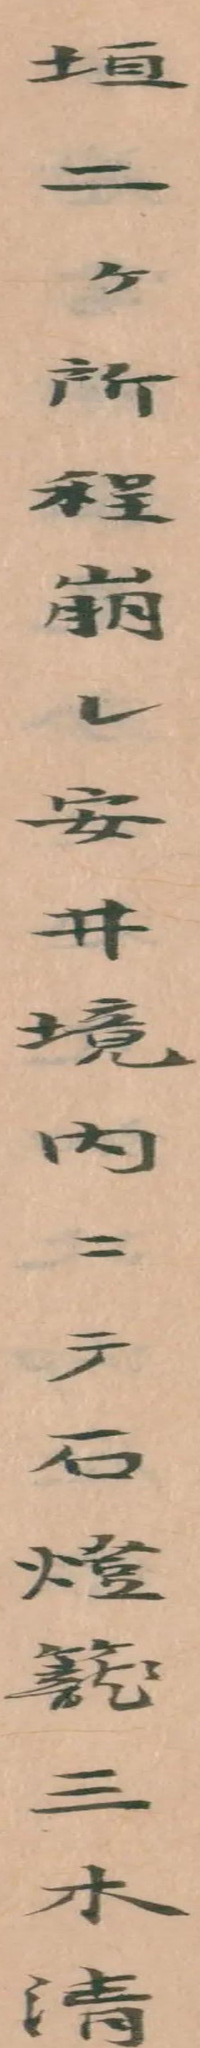垣二ヶ所程崩レ安井境内ニテ石燈籠三木清
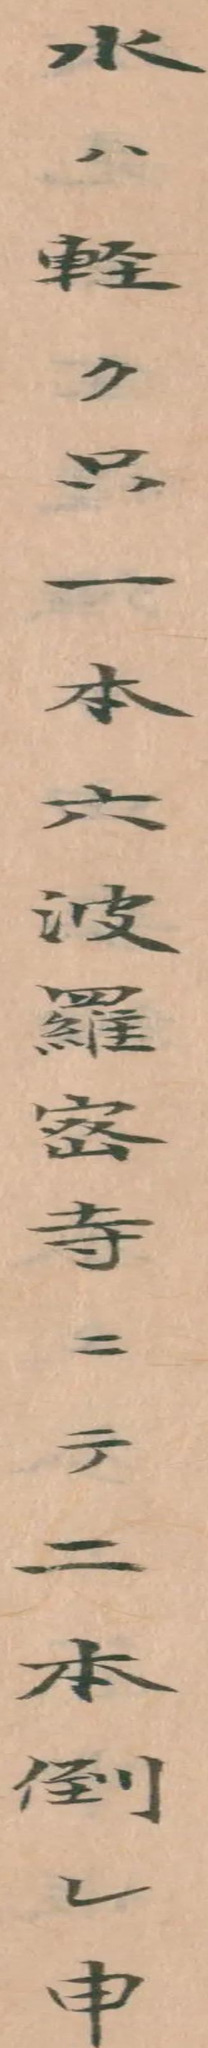水ハ軽ク只一本六波羅密寺ニテ三本倒レ申
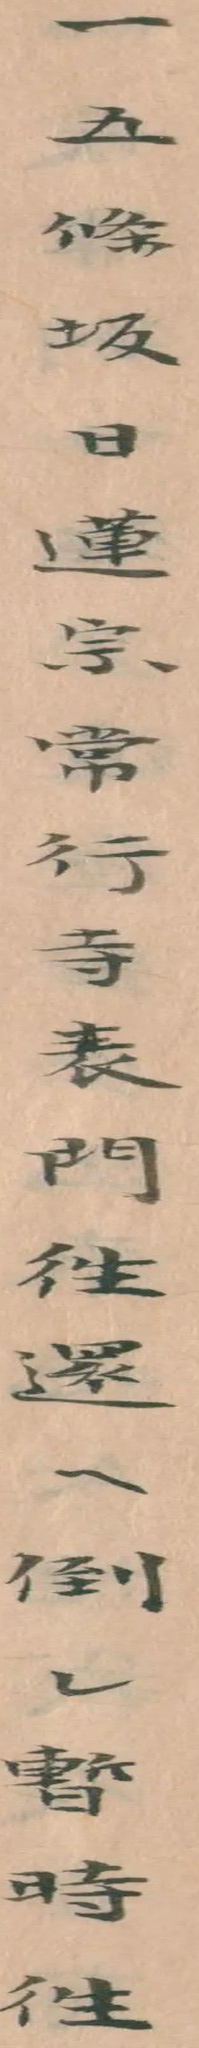一五條坂日蓮宗常行寺表門往還へ倒レ暫時往
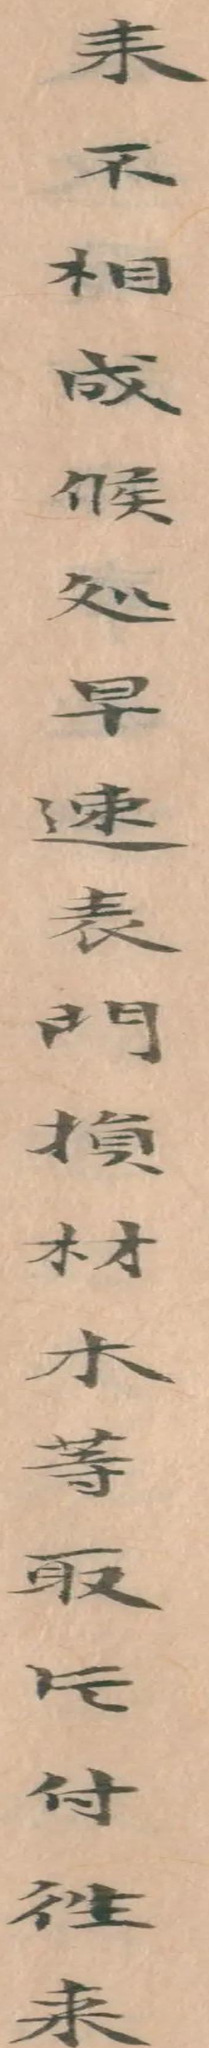来不相成候処早速表門損材木等取片付往来
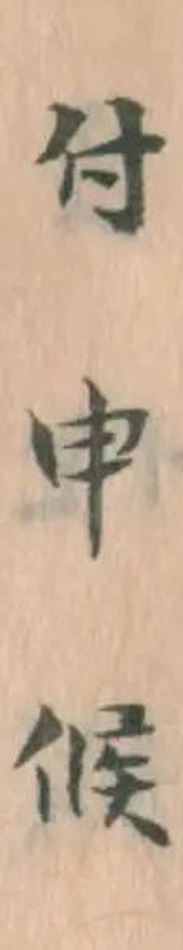付申候
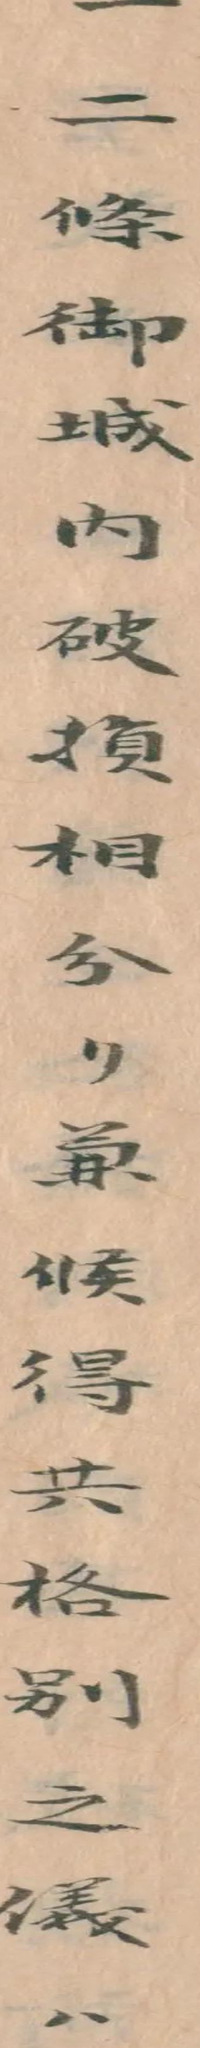一二條御城内破損相分り兼候得共格別之儀ハ
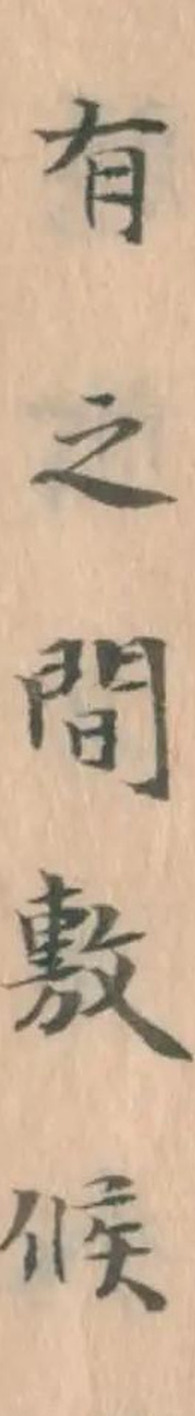有之間敷候

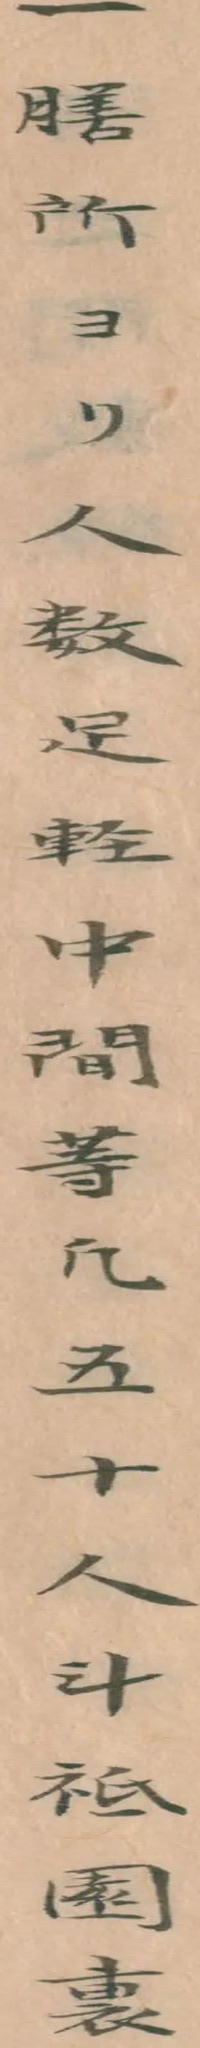一膳所ヨリ人数足軽中間等凡五十人斗祇園裏
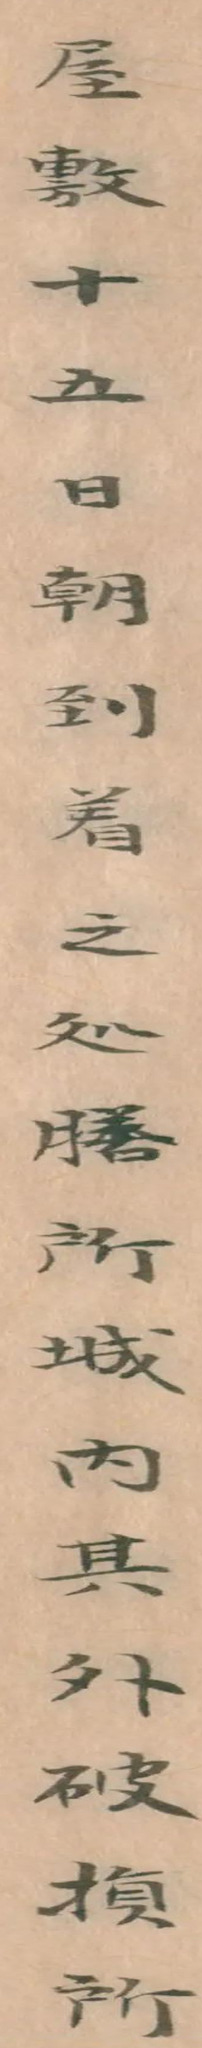屋敷十五日朝到着之処膳所城内其外破損所
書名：地災撮要. 巻1(噴火山・地震ノ部)
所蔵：国立国会図書館 National Diet Library, JAPAN
